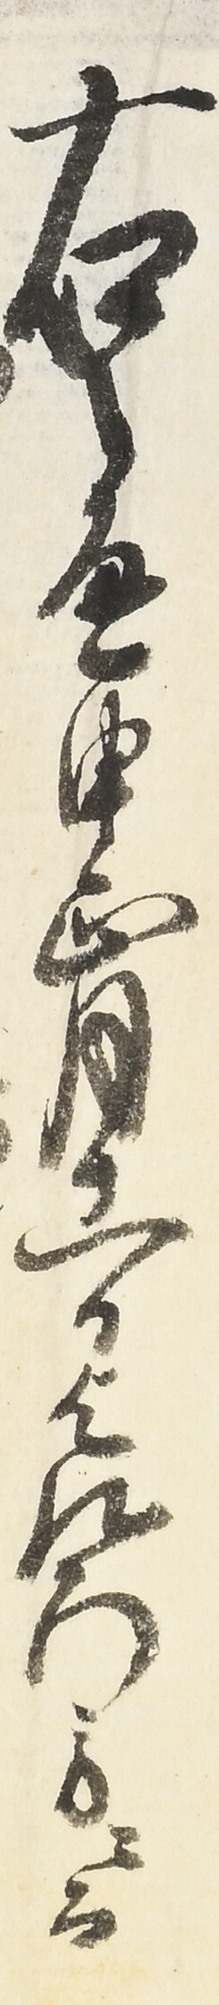右之通申正月十一日与左衛門方ニ而
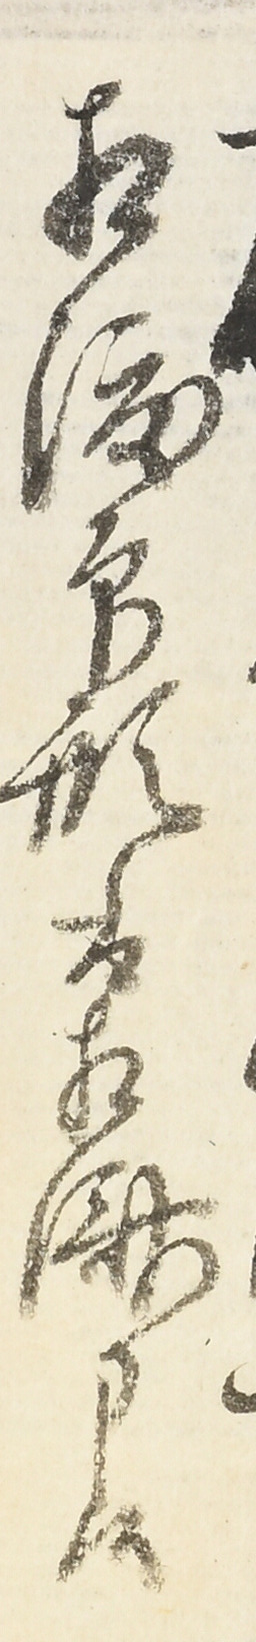相渡印形被相済申候

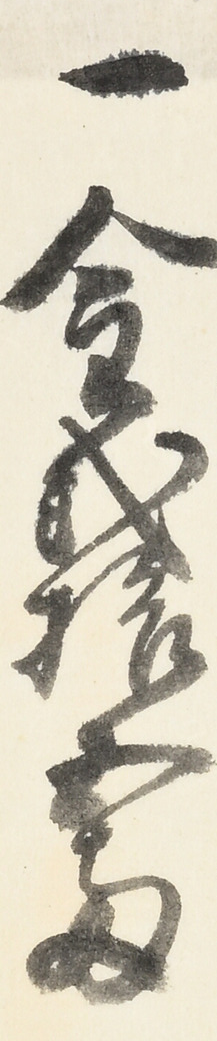一金弐拾五両
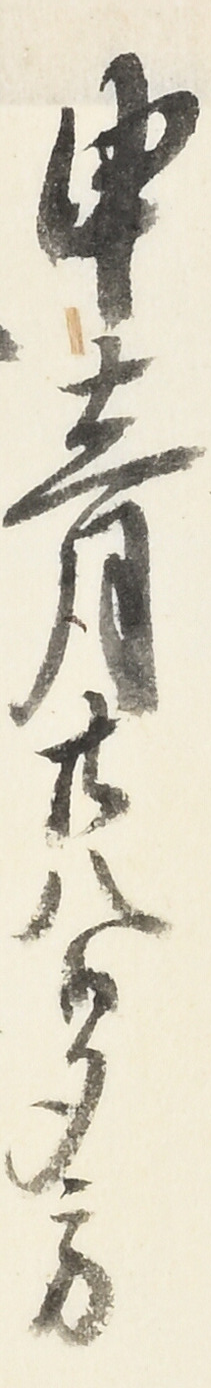申未十二月廿八日夕方
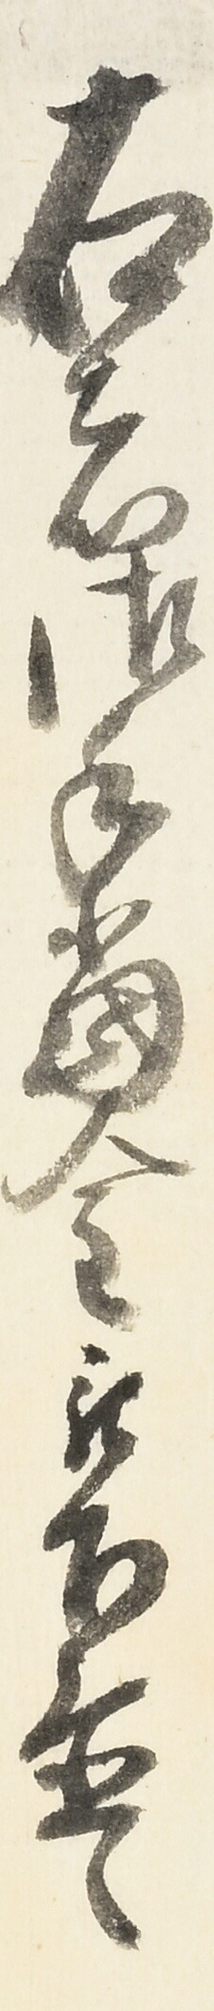右者御手当金被下置候
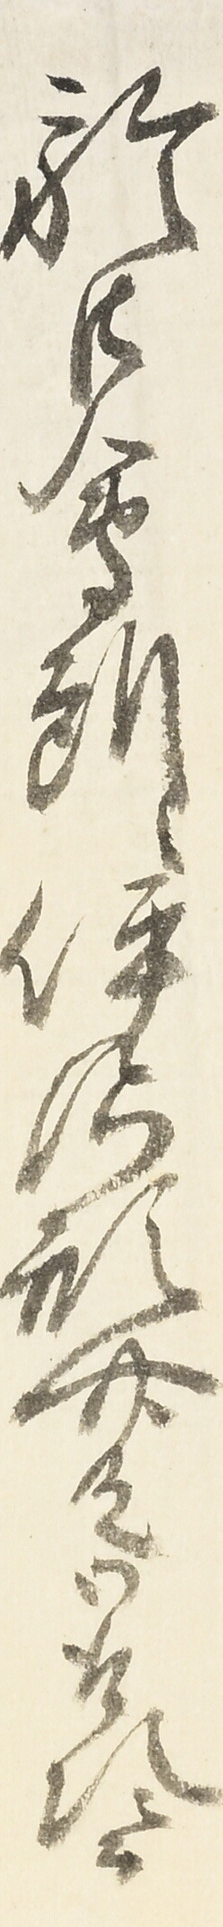於御会所伊沢形介殿御取次ニ而
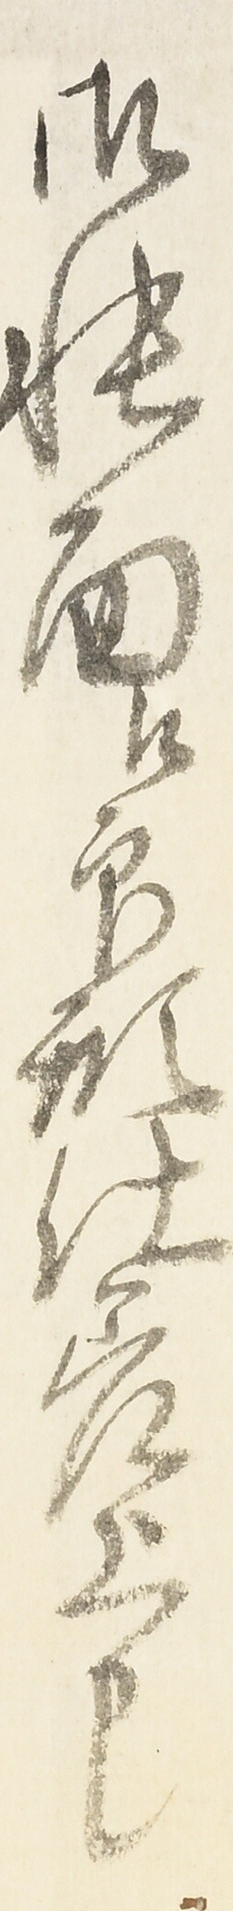御帳面江印形仕差上申候
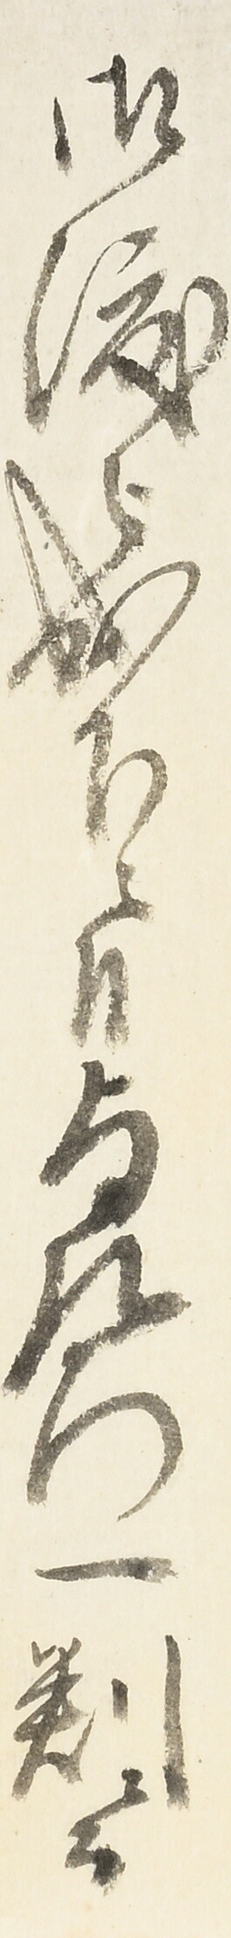御渡被成下ニ付与左衛門一判ニ而
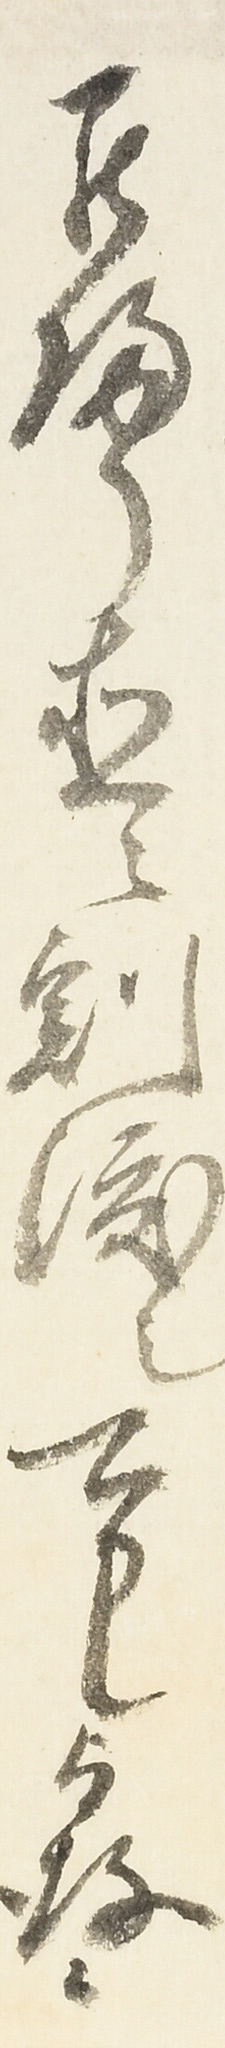罷帰り直ニ割渡し可申候と存候
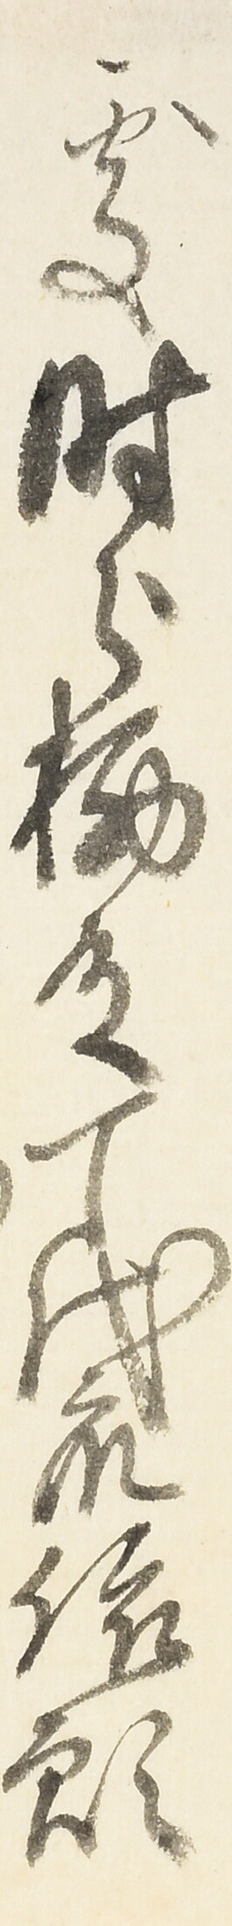處時分柄故丁代衆依願
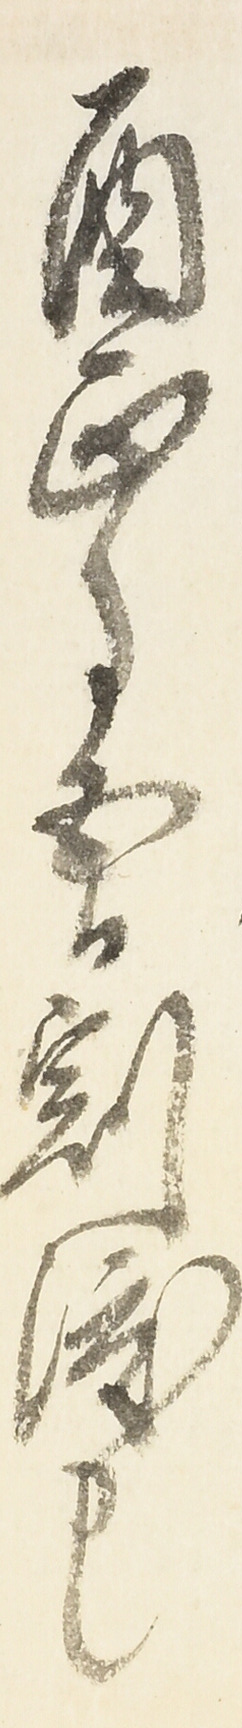酉正月五日割渡申候
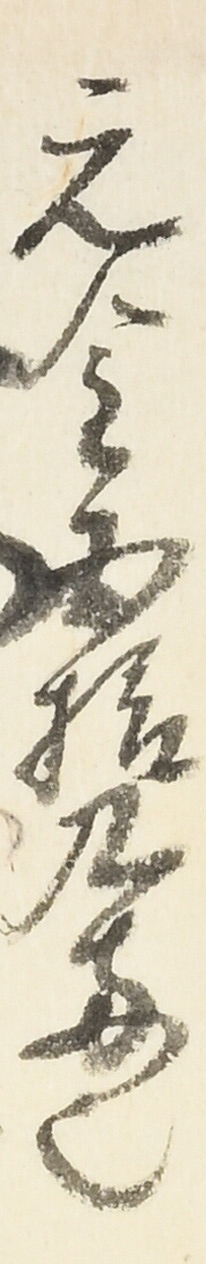元金五拾九両也
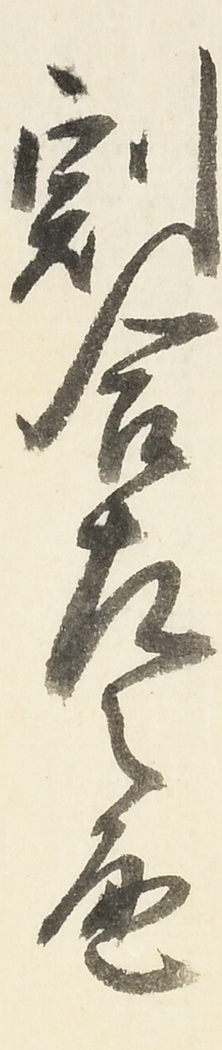割合左之通
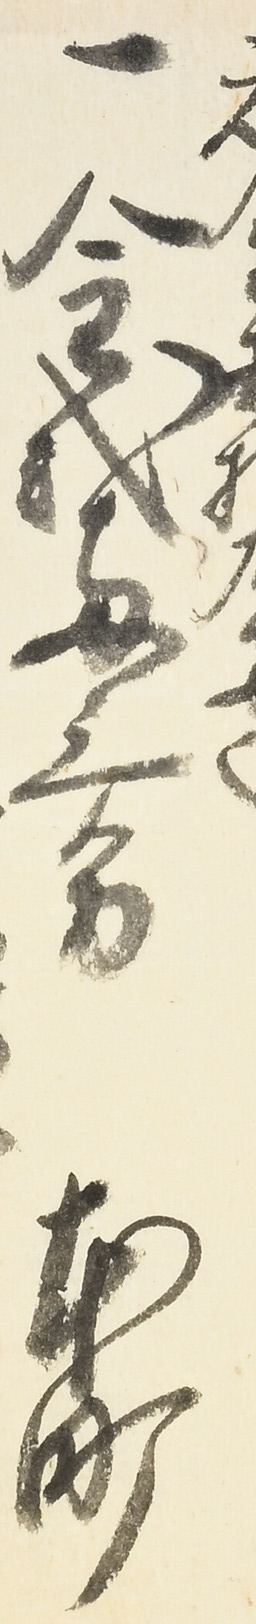一金弐両三分本町
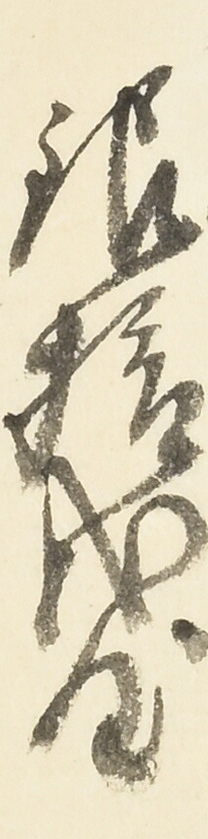銀拾弐匁
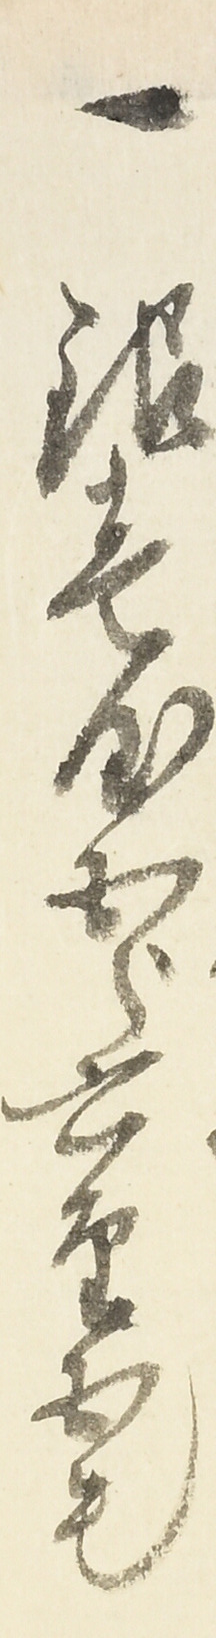一銀壱匁五分六厘五毛
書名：御才覚金御利足割渡扣帳
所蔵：伊那市立高遠町図書館・合同会社AMANE
